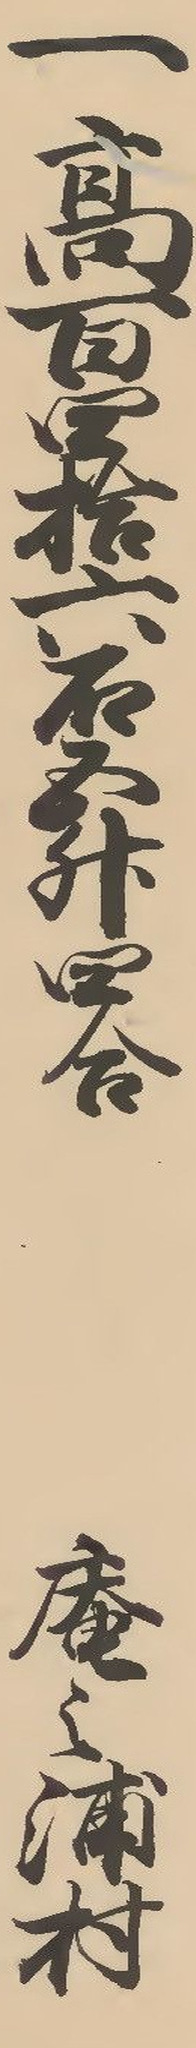一髙百四拾六石五升四合庵之浦村
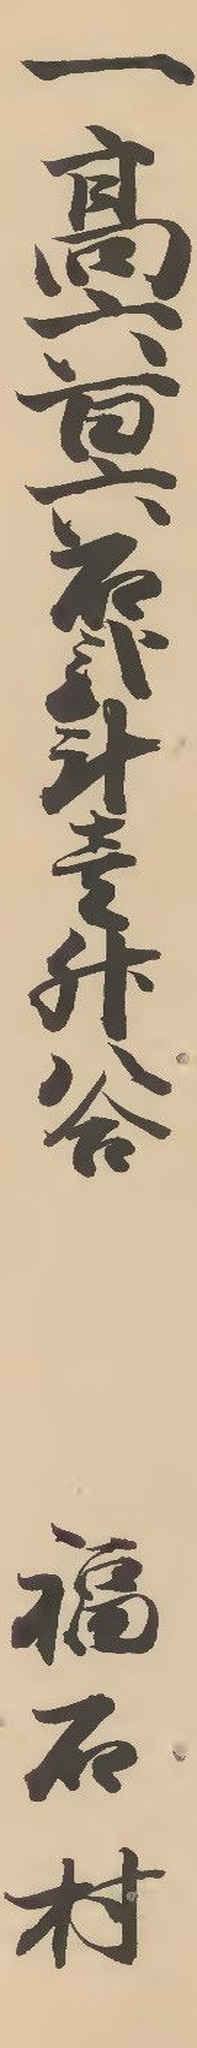一髙六百六石弐斗壱升八合福石村
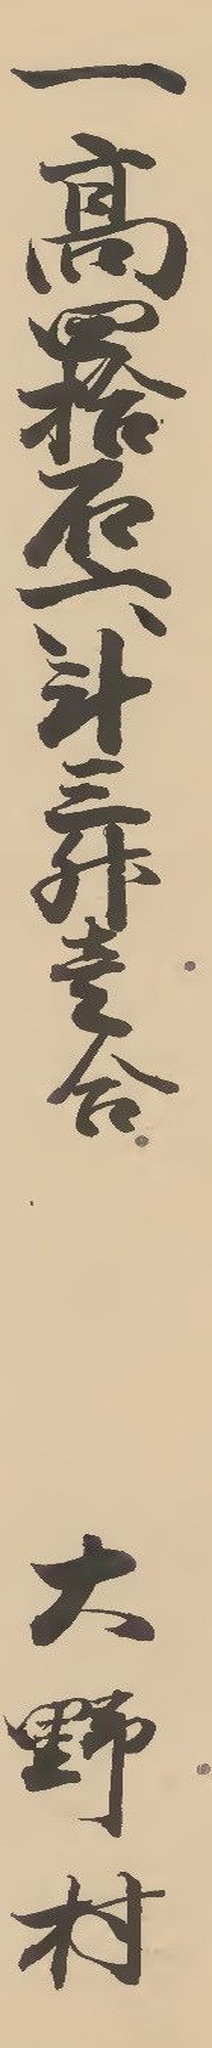一髙四拾石六斗三升壱合大野村
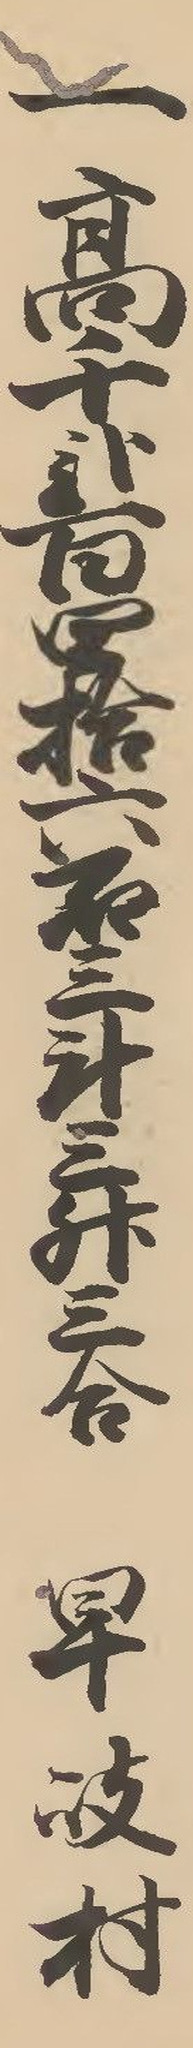一髙千弐百四拾六石三斗三升三合早岐村

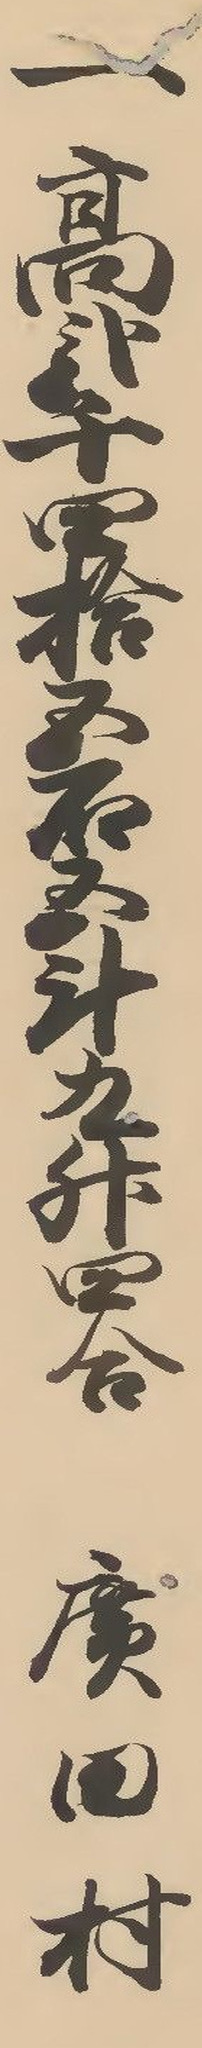一髙弐千四拾五石五斗九升四合廣田村
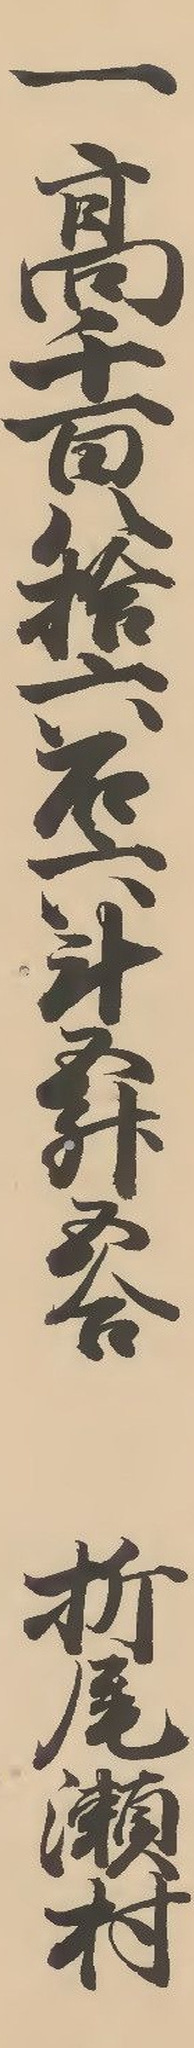一髙千百八拾六石六斗五升五合折尾瀬村
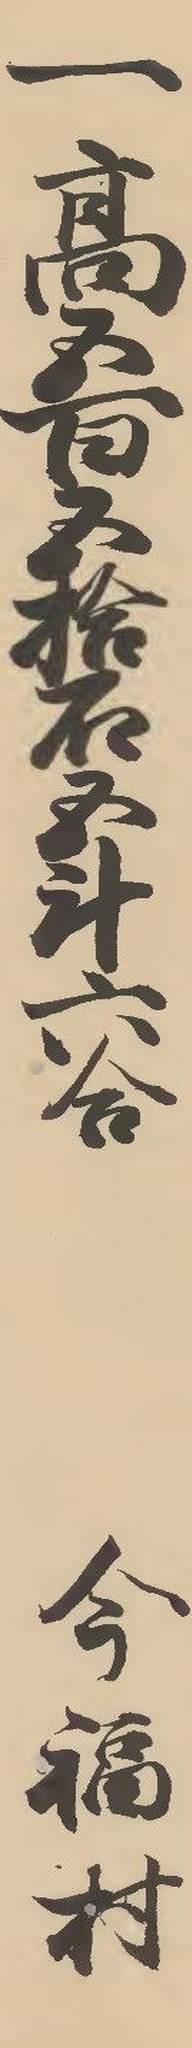一髙五百五拾石五斗六合今福村
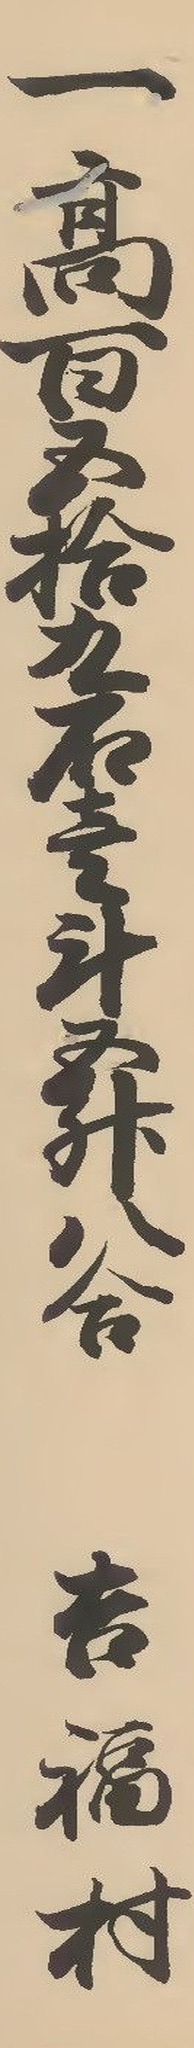一髙百五拾九石壱斗五升八合吉福村
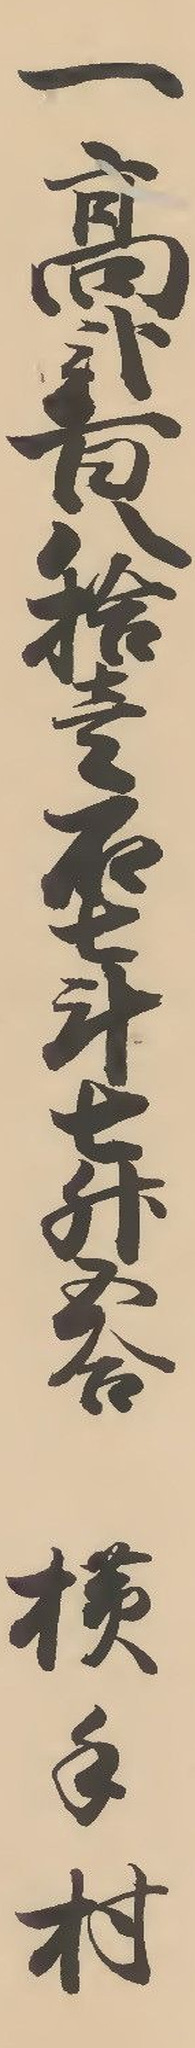一髙弐百八拾壱石七斗七升五合横手村
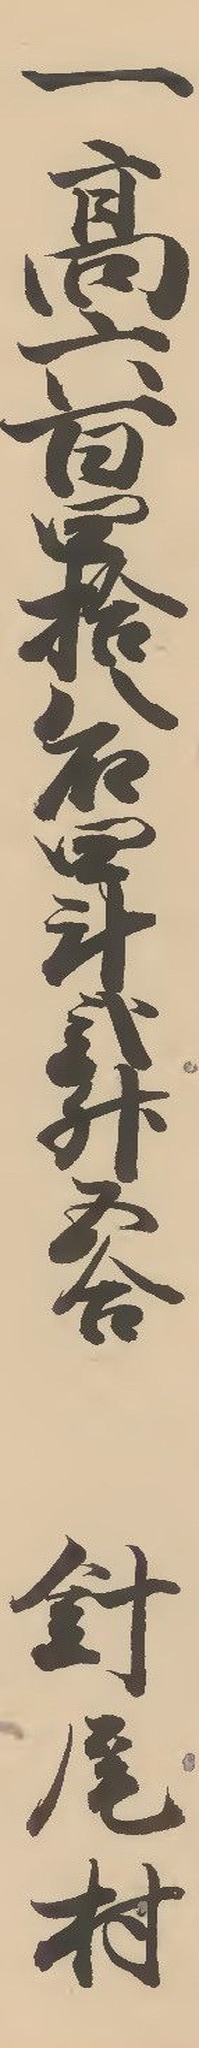一髙六百四拾八石四斗弐升五合針尾村
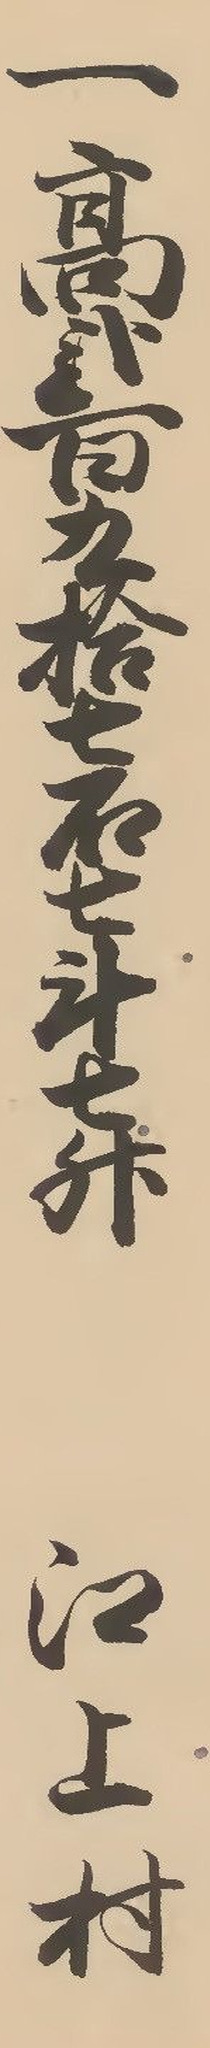一髙弐百九拾七石七斗七升江上村
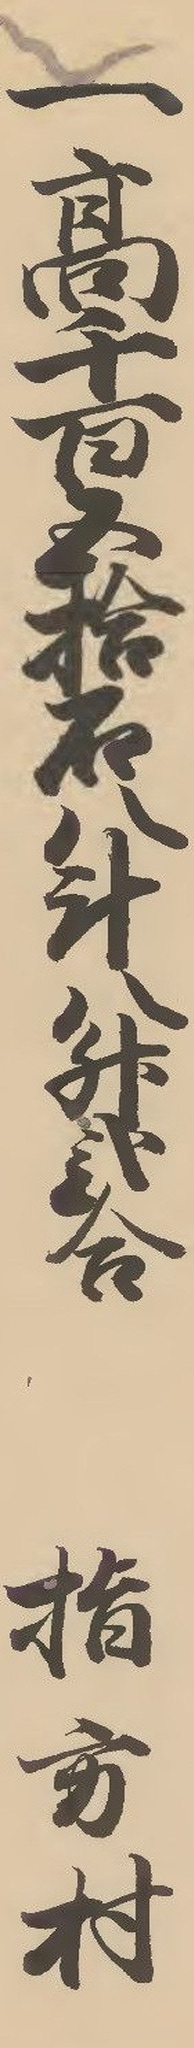一髙千百五拾石八斗八升弐合指方村

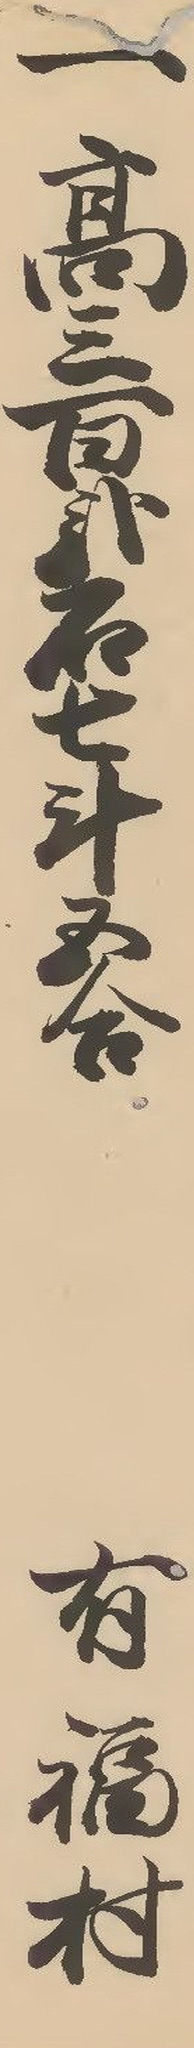一髙三百弐石七斗五合有福村
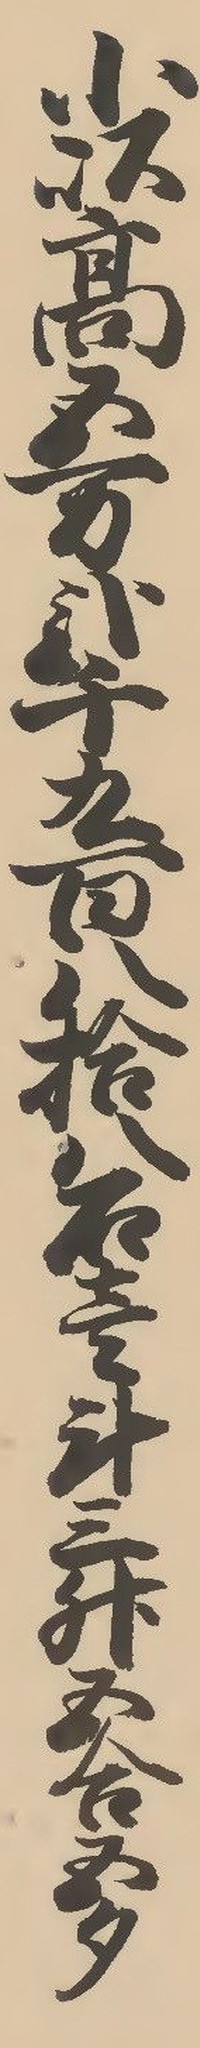小以髙五万弐千九百八拾八石壱斗三升五合五夕
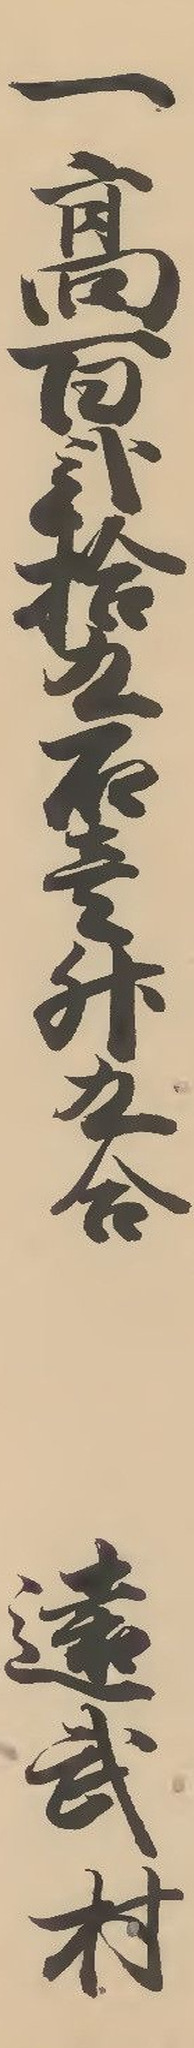一髙百弐拾九石壱升九合遠武村
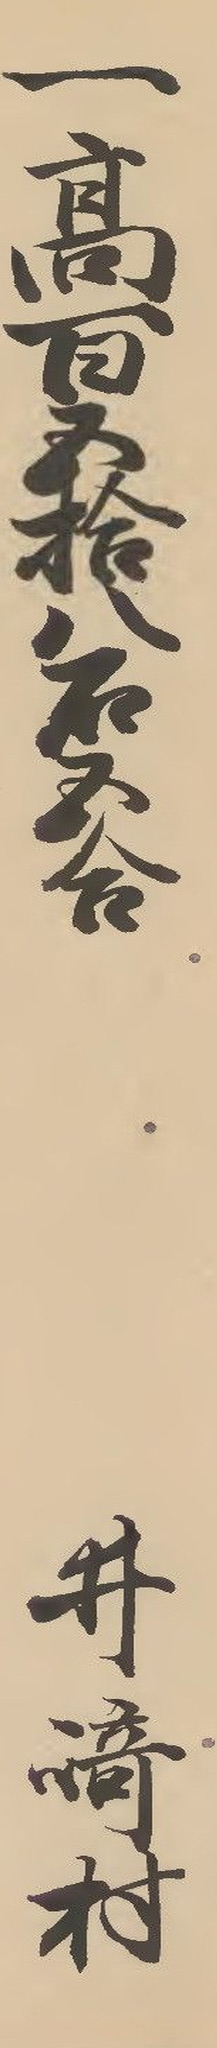一髙百五拾八石五合井崎村
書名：肥前国郷帳
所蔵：国立公文書館 National Archives of Japan
